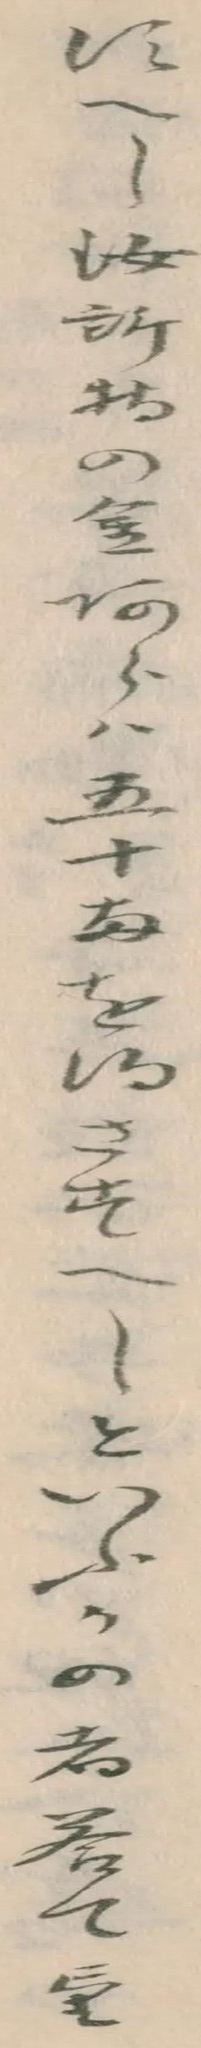すへし汝所得の金あらは五十両を得さすへしといふかの者答て望
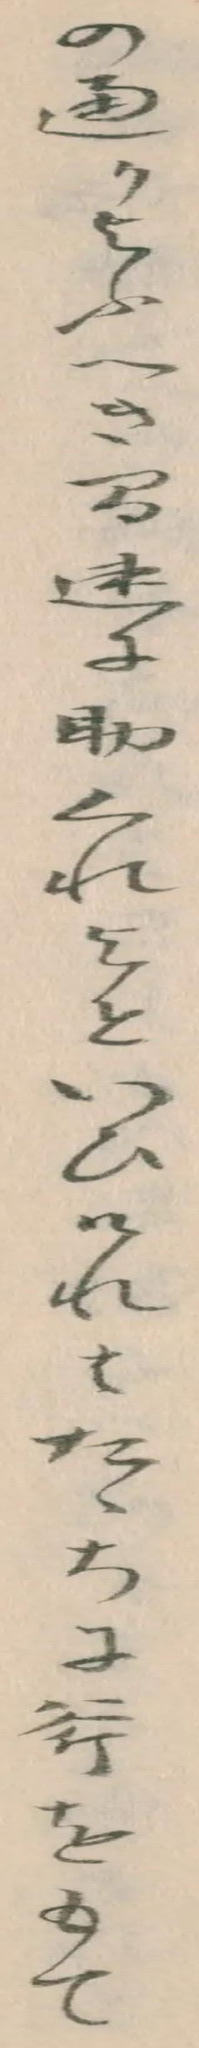の通り与ふへき間速に助くれよといひけれはたゝちに斧をもて
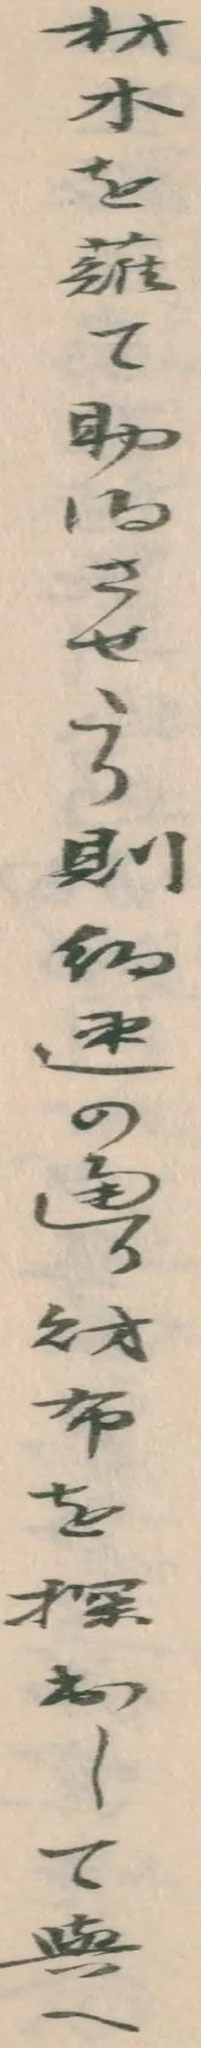材木を薙て助得させたり則約束の通り財布を探出して与へ
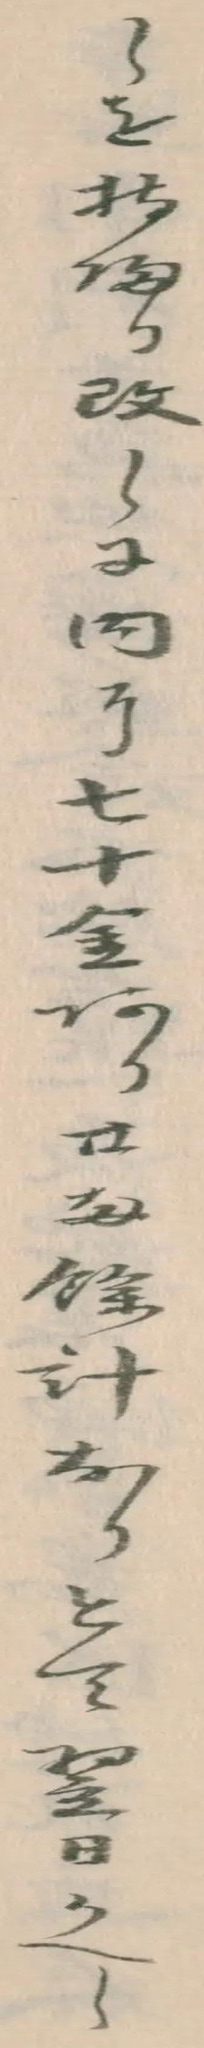しを持帰り改しに内に七十金あり廿両余計なりとて翌日かへし
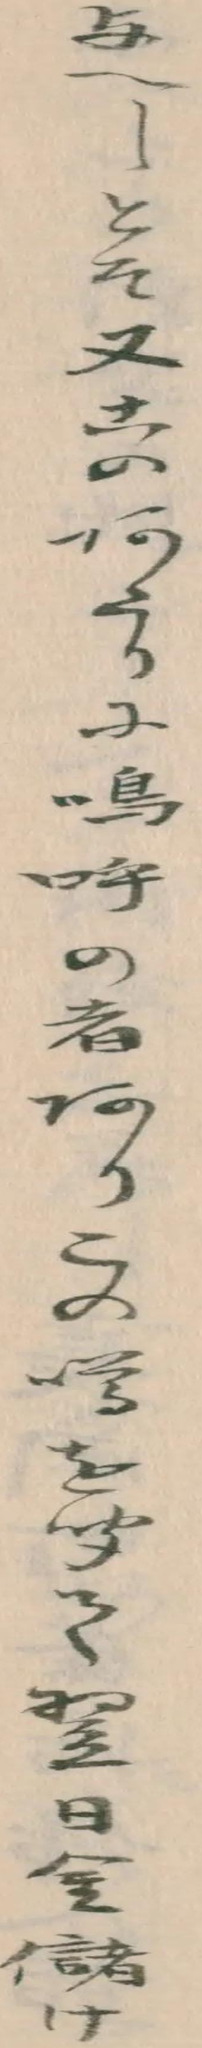与へしとそ又このあたりに嗚呼の者ありこの噂を聞て翌日金儲け
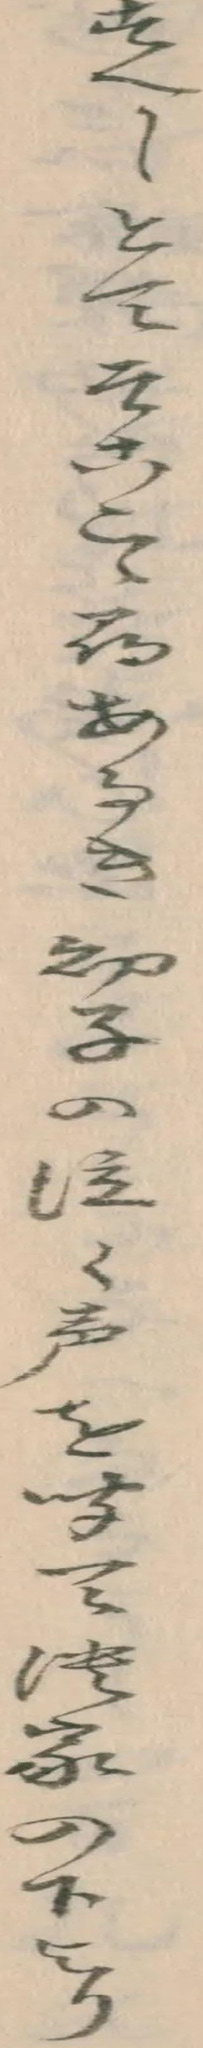すへしとてそここゝ尋あるき幼子の泣く声聞て潰家の下より
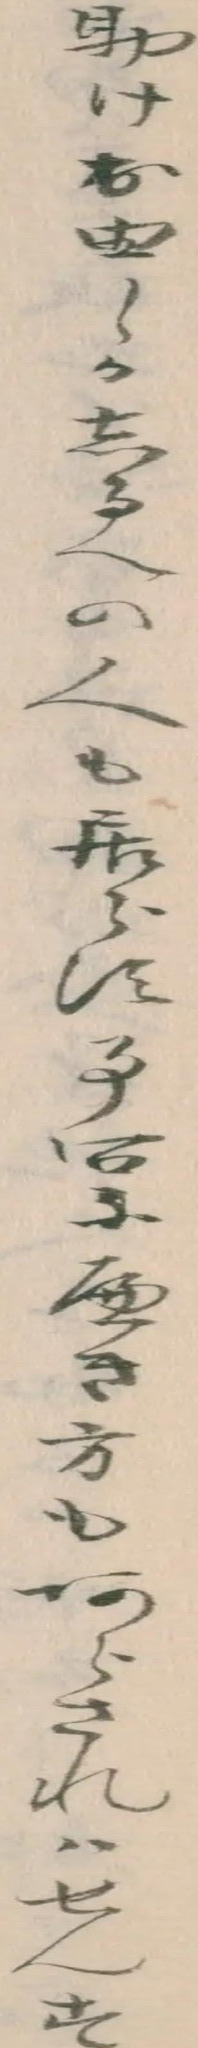助け出由しかしるへの人も居らす事問ふへき方もあらされはせんす
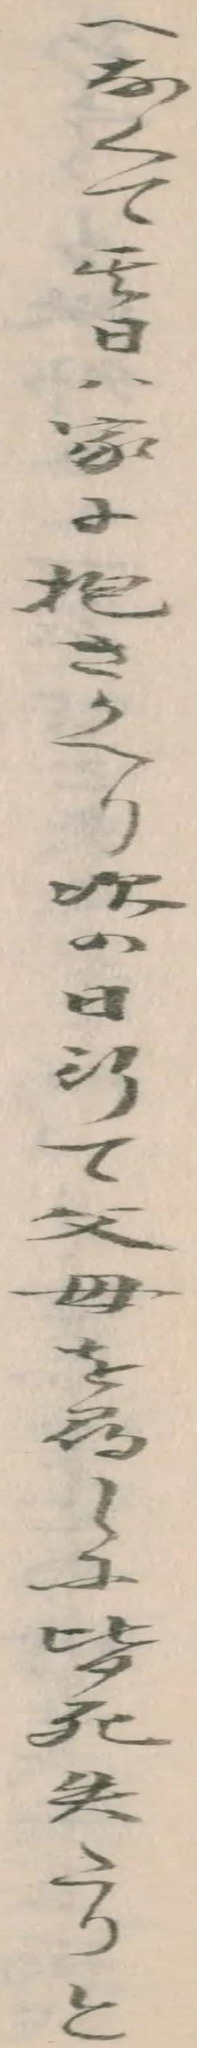へなくて其日は家に抱きかへり次の日行て父母を尋しに皆死失たりと
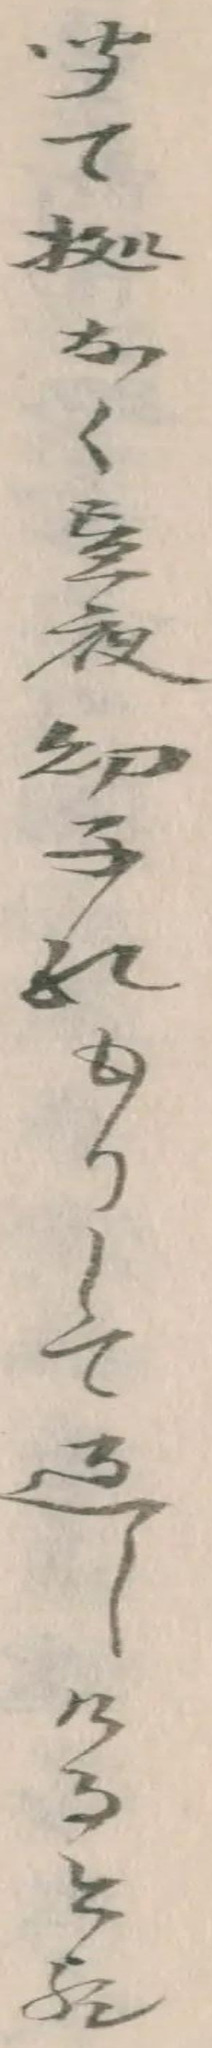聞て拠なく昼夜幼子類もりして過しけるとそ
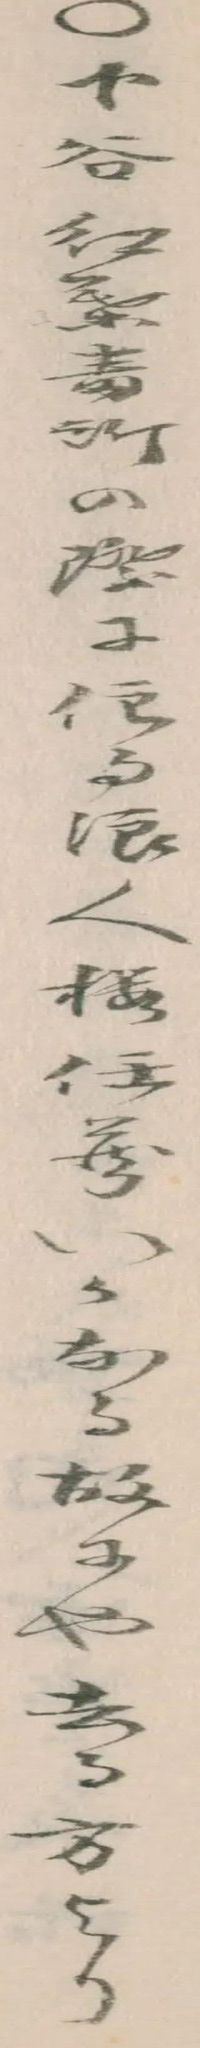〇下谷紅葉番所の際に住る浪人桜任蔵いかなる故にや去る方より
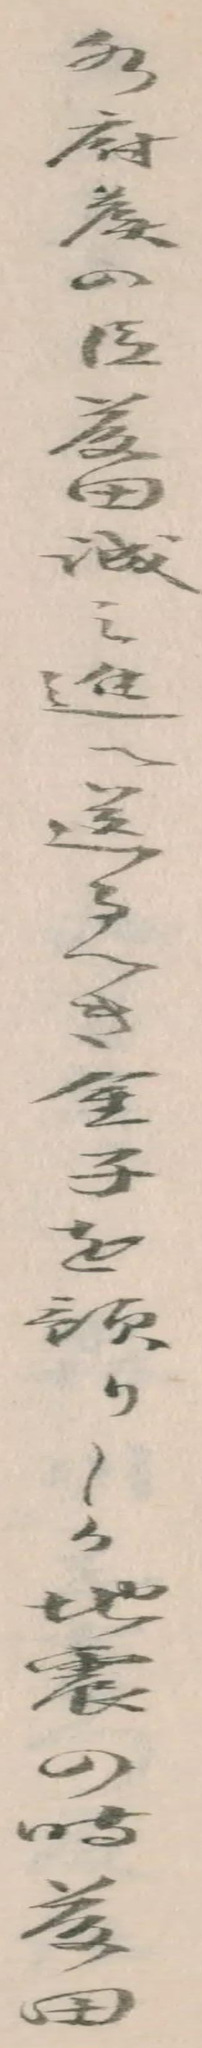水府侯の臣藤田誠之進へ送るへき金子を預りしか地震の時藤田
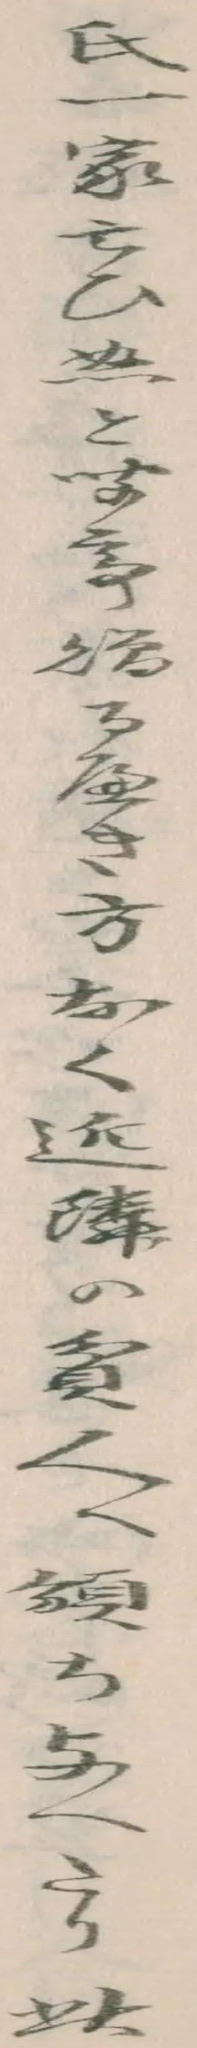氏一家亡ひぬと聞て贈るへき方なく近隣の貧人へ頒ち与へたり此
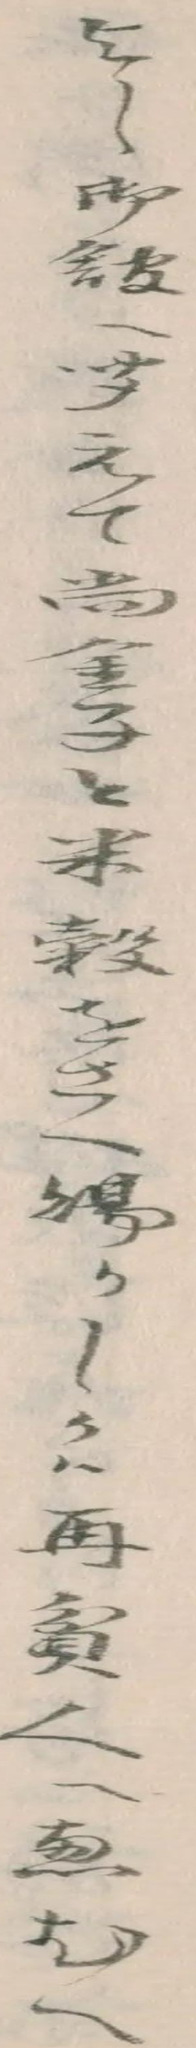よし御舘へ聞えて尚金子と米穀をさへ賜りしかは再貧人へ恵むへ
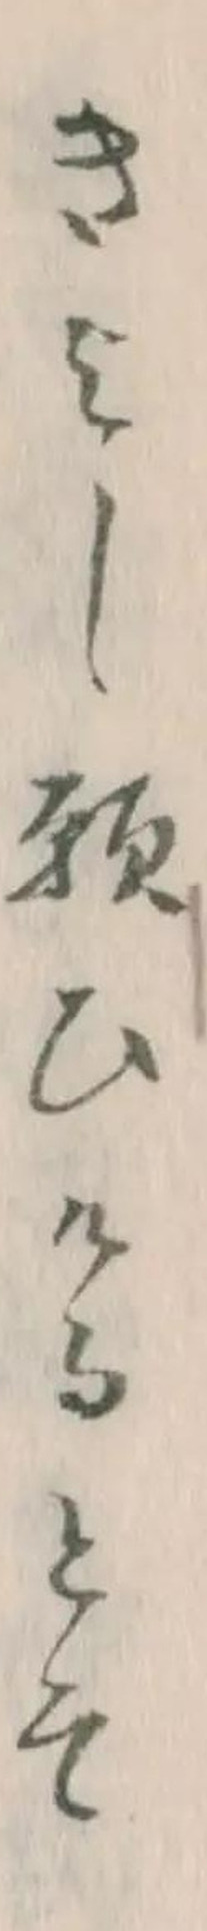きよし願ひけるとそ
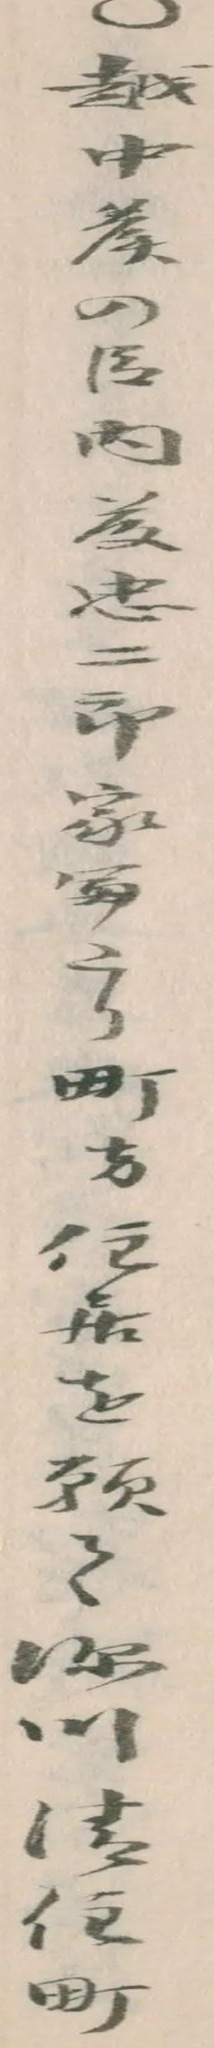〇越中侯の臣内藤忠二郎家冨たり町方住居を願て深川清住町
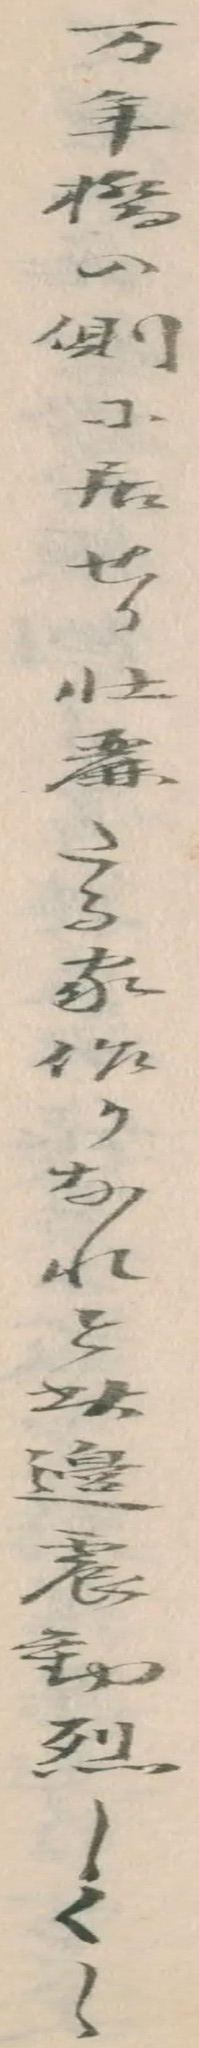万年橋の側に居せり壮麗たる家作りなれと此辺振動烈しくし
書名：地災撮要. 巻7-9(地震之部)
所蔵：国立国会図書館 National Diet Library, JAPAN
